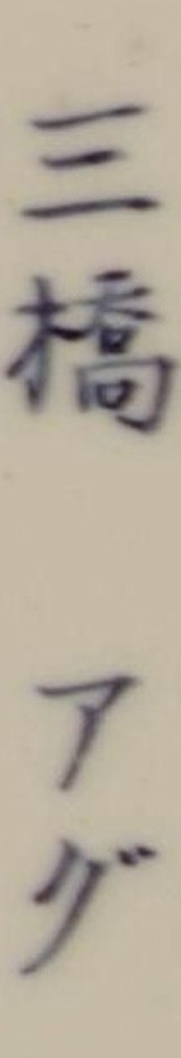三橋アグ
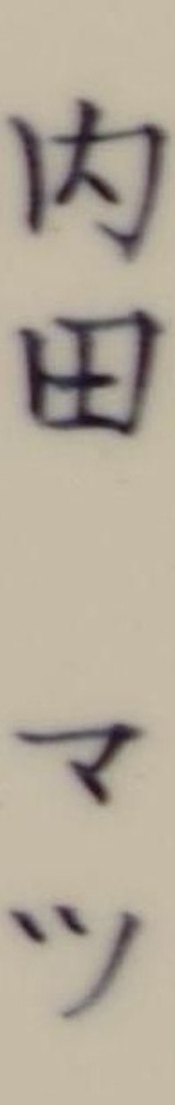内田マツ
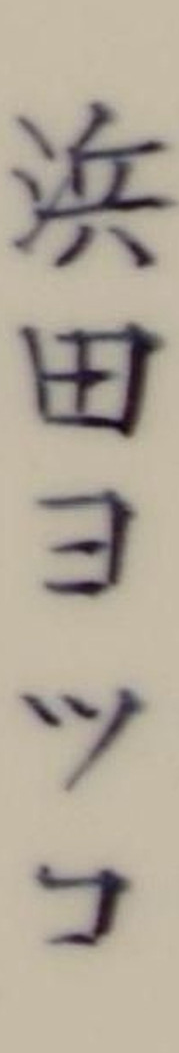浜田ヨツコ
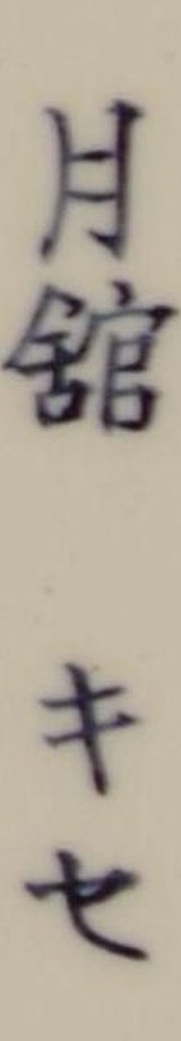月舘キセ
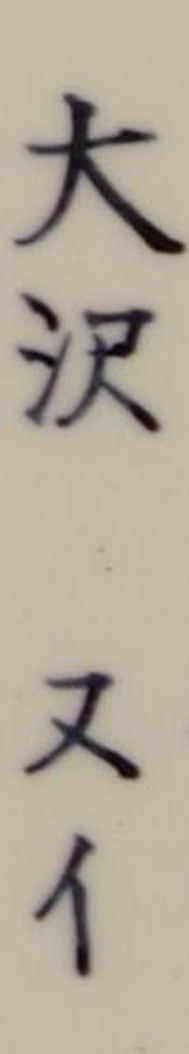大沢ヌイ
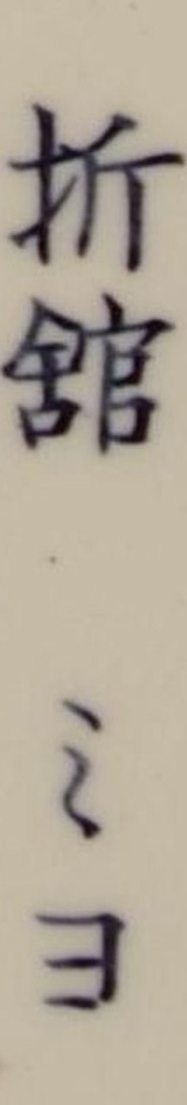折館ミヨ
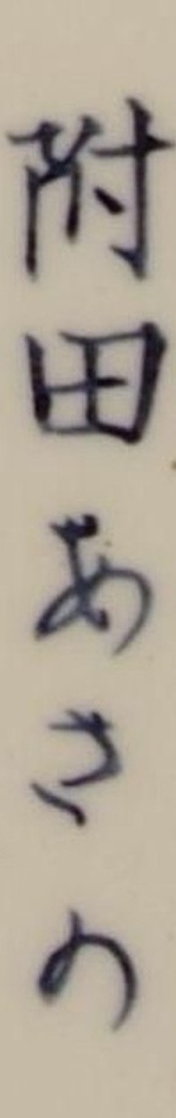附田あさの
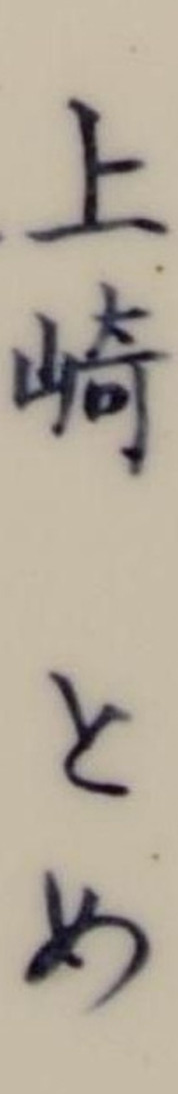上崎とめ
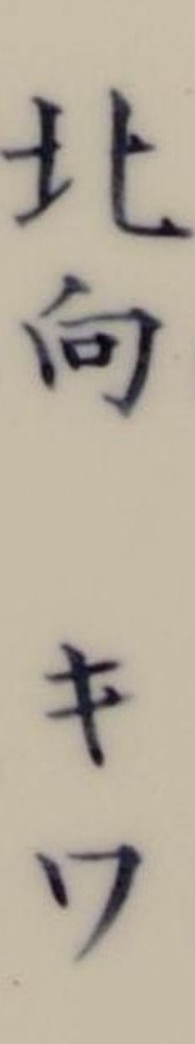北向キワ
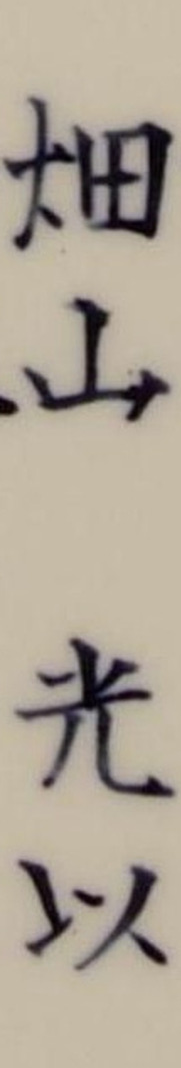畑山光以
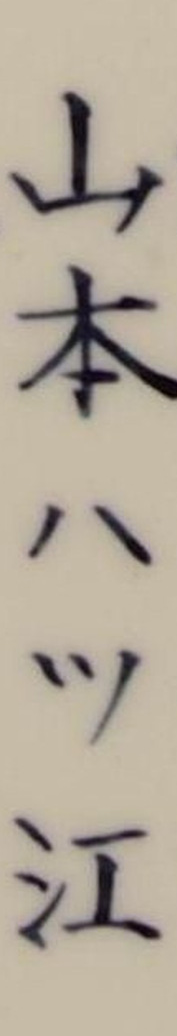山本ハツ江
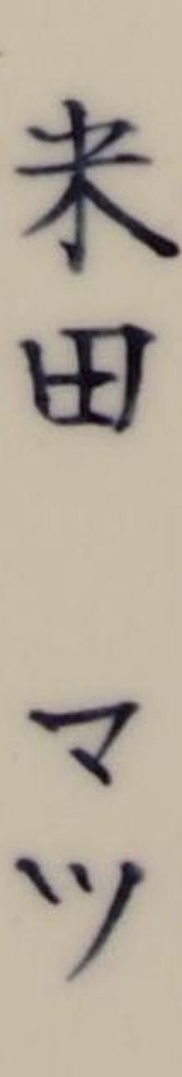米田マツ
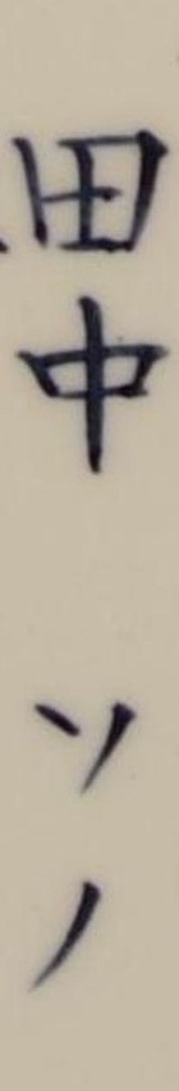田中ソノ
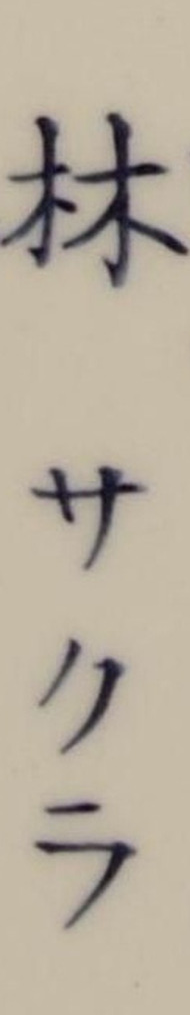林サクラ
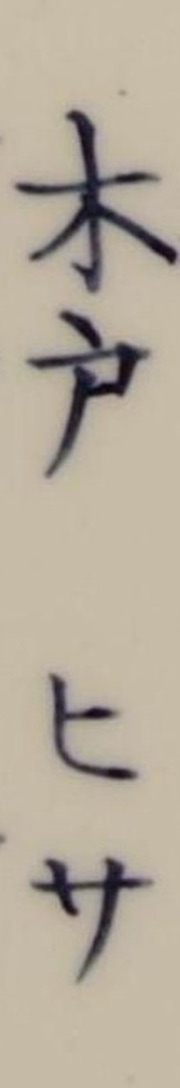木戸ヒサ
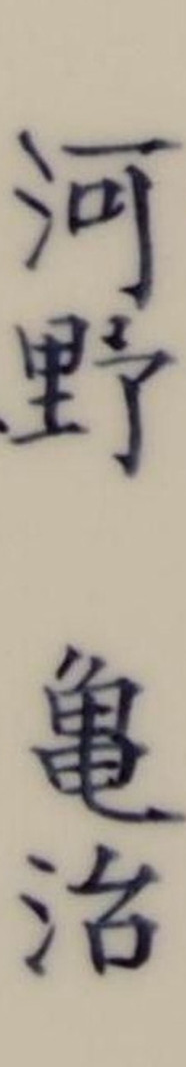河野亀治
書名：M~S
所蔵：高野山金剛峯寺
